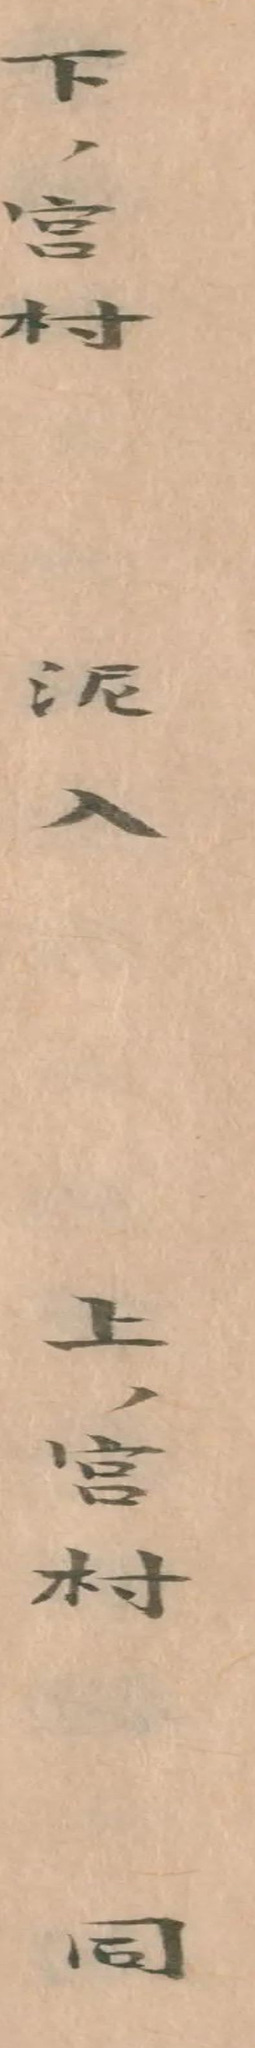下ノ宮村泥入上ノ宮村同
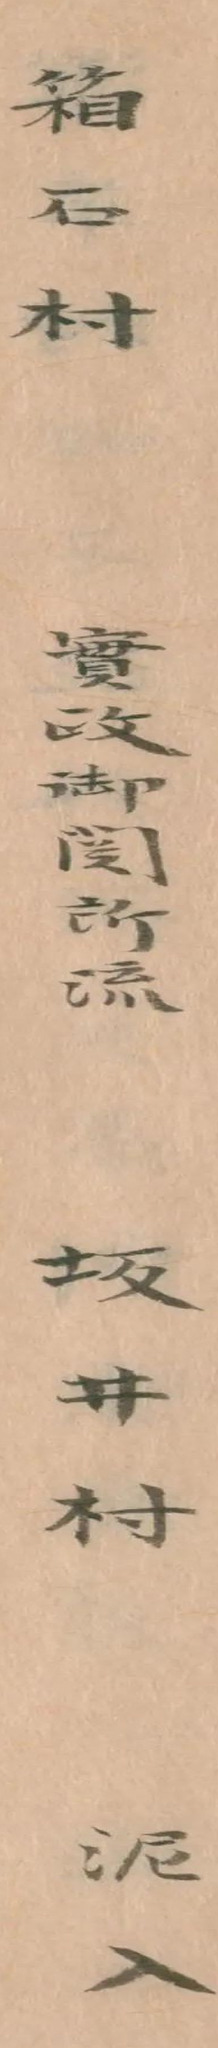箱石村実改御関所流坂井村泥入
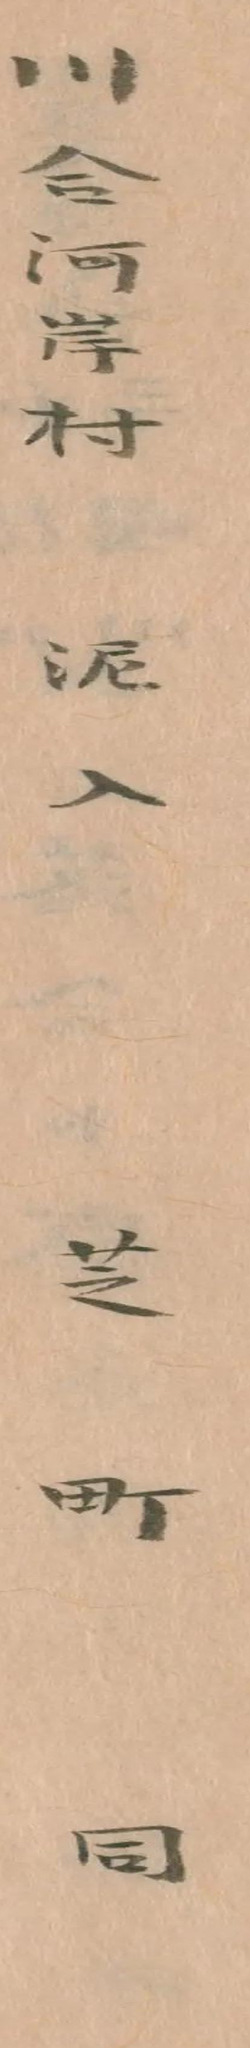川合河岸村泥入芝町同
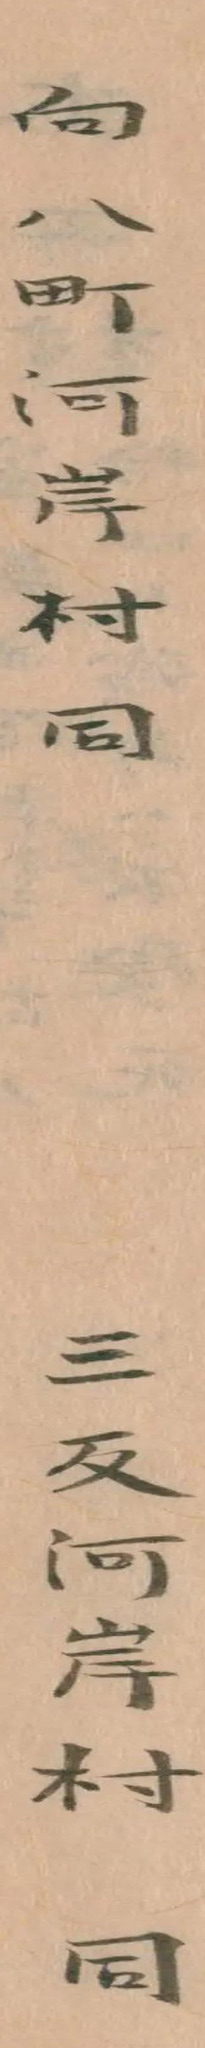向八町河岸村同三反河岸同
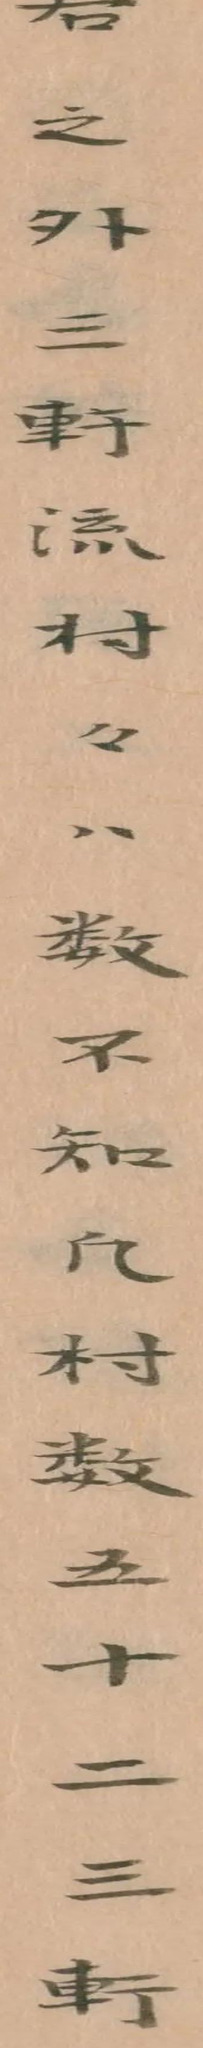右之外三軒流村々ハ数不知凡村数五十二三軒
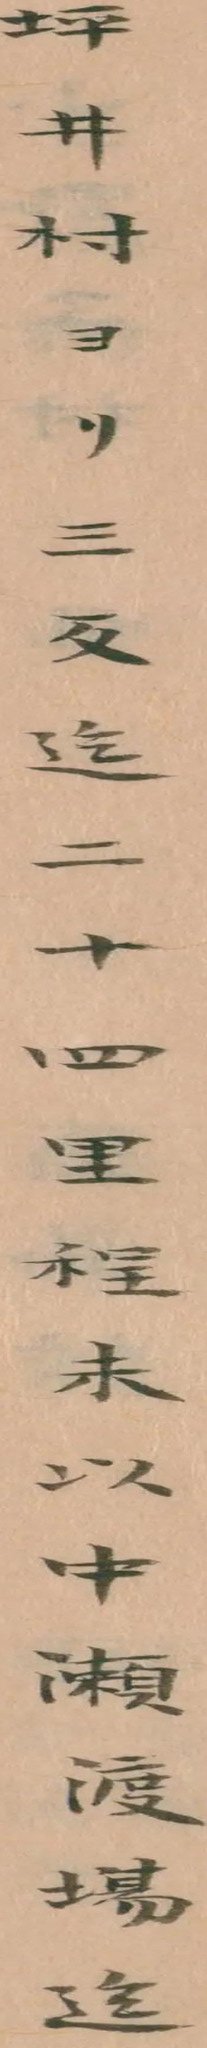坪井村ヨリ三反迄二十四里程未以中瀬渡場迄
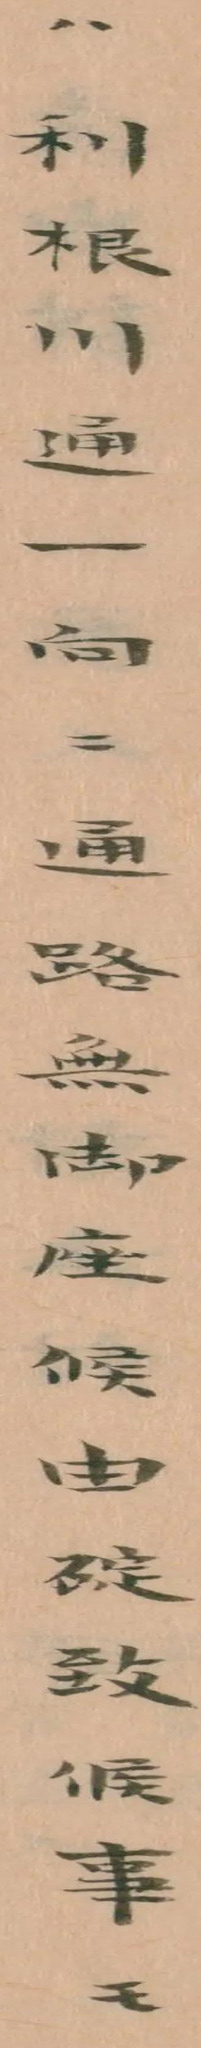ハ利根川通一向二通路無御座候由碇致候事モ
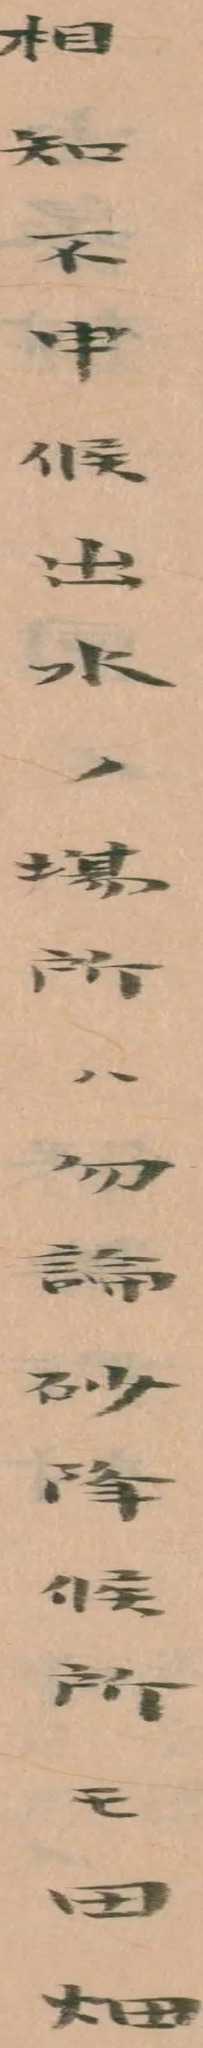相知不申候出水ノ場所ハ勿論砂降候所モ田畑
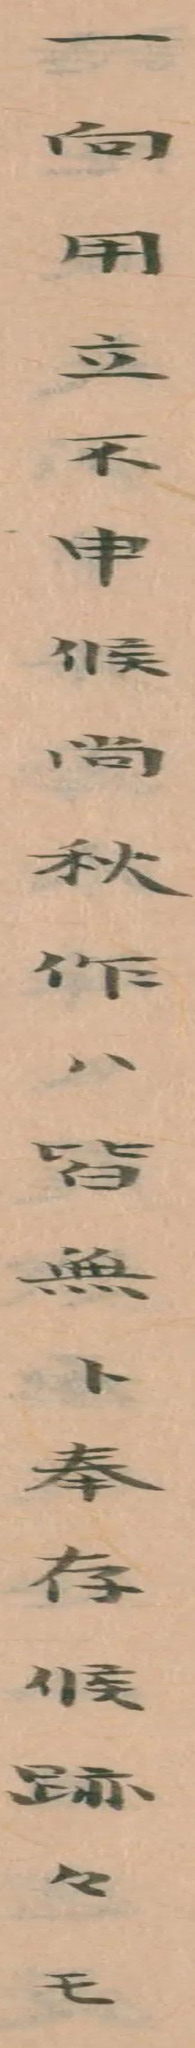一向用立不申候尚秋作ハ皆無ト奉存候跡々モ
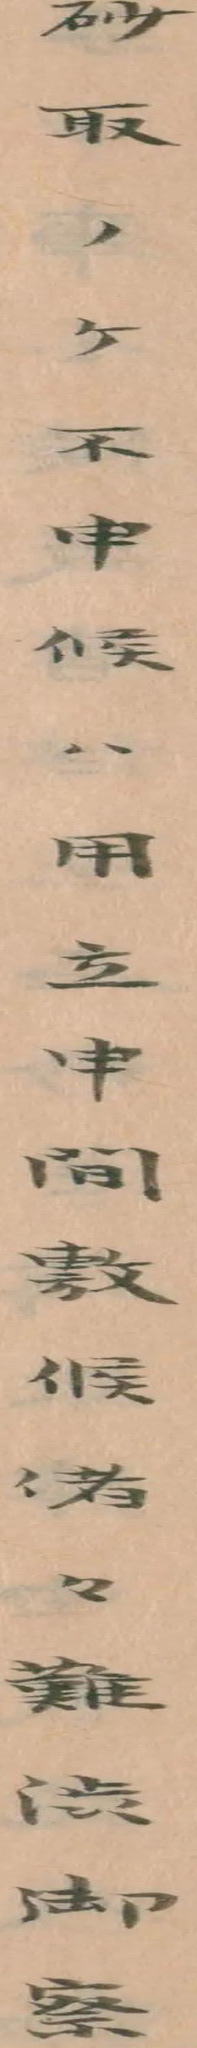砂取ノケ不申候ハ用立申間敷候偖々難渋御察
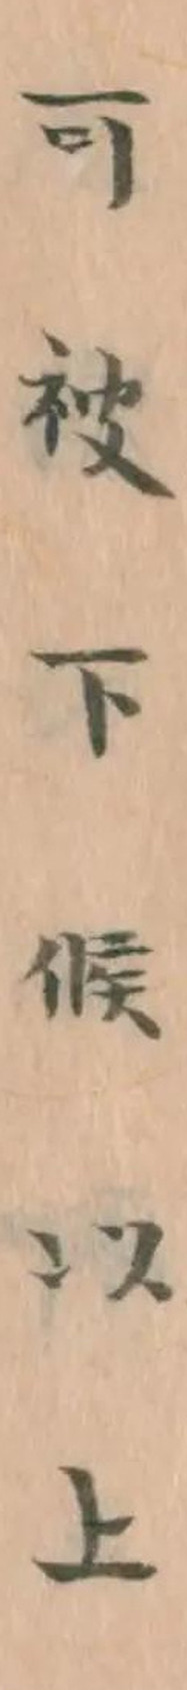可被下候以上
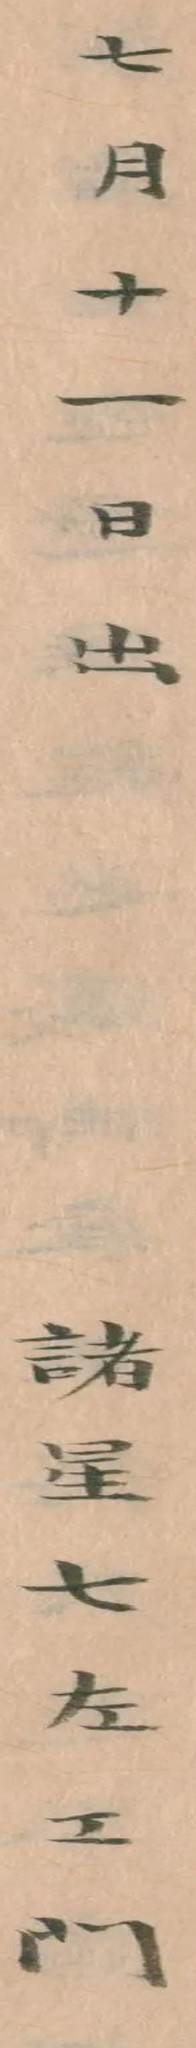七月十一日出諸星七左衛門
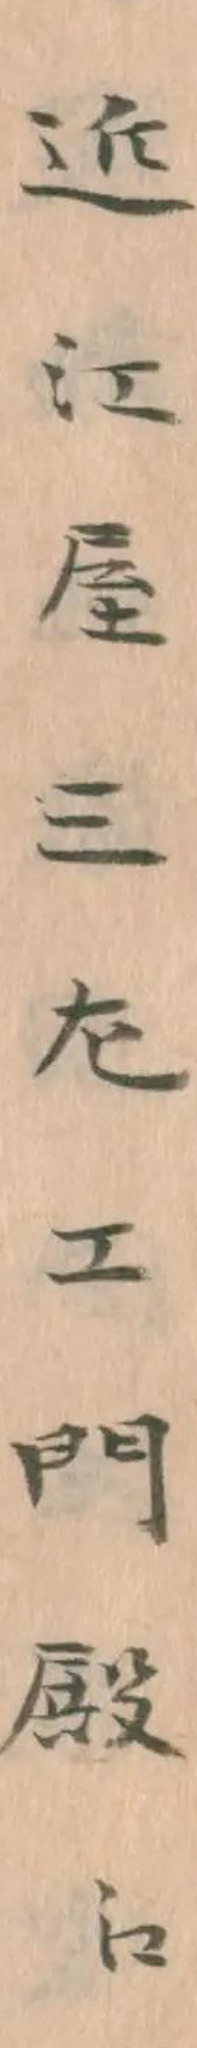近江屋三左衛門殿江
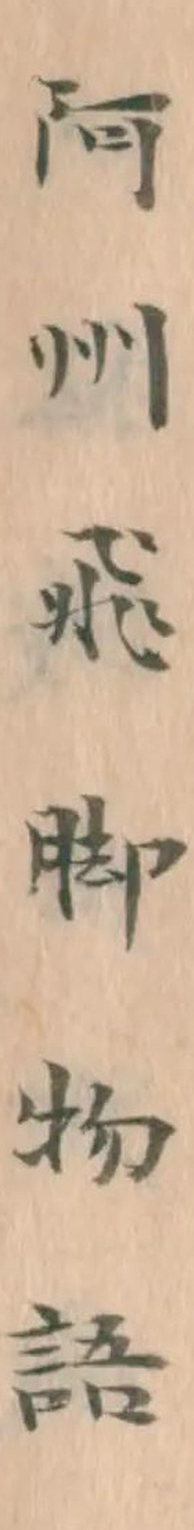阿州飛脚物語
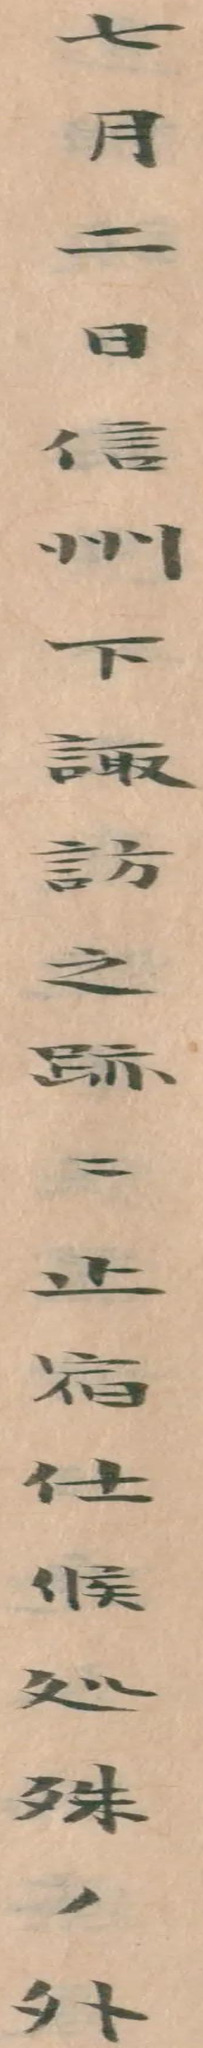七月二日信州下諏訪之跡ニ止宿仕候処殊ノ外
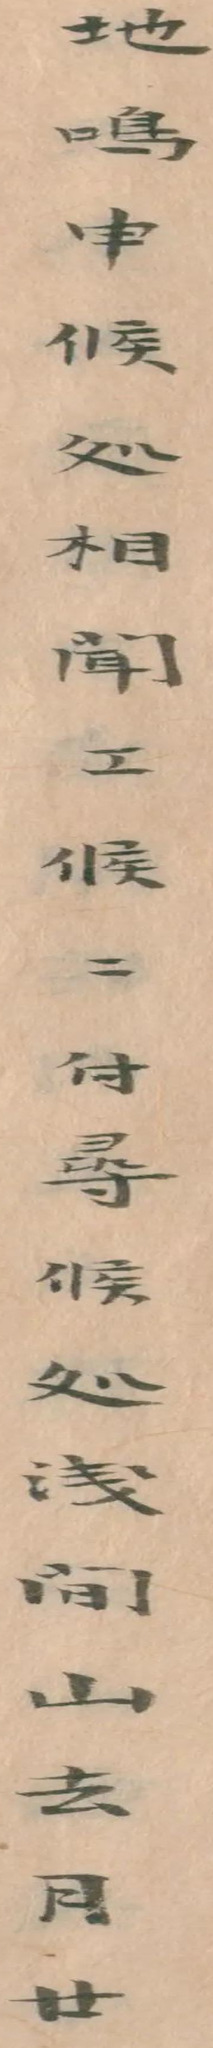地鳴申候処相聞エ候二付尋候処浅間山去月廿
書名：地災撮要. 巻1(噴火山・地震ノ部)
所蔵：国立国会図書館 National Diet Library, JAPAN
